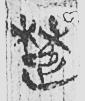楚
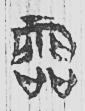霝
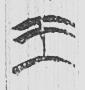王
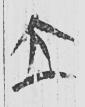立
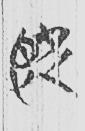既
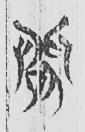{門夕刀}
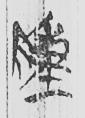陳
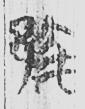○（蔡）
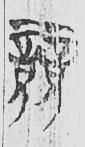競
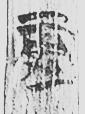坪
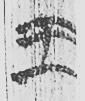王
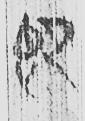即
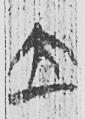立
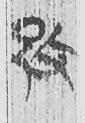改
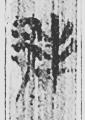邦
